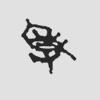事
